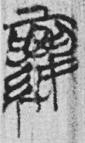縷
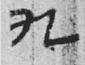九
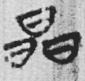晶
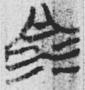汬
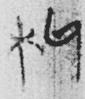朻（救）
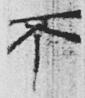不
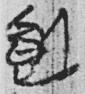飤（食）
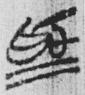爲
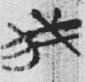我
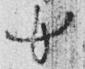心
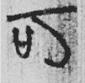可
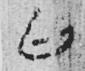㠯（以）
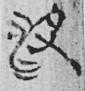汲
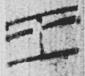王
